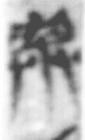與
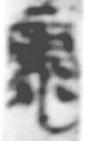彔（綠）
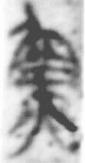魚
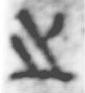之
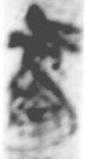○（箙）
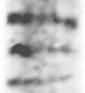三
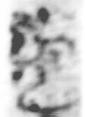○（貍）
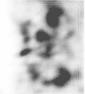○（貘）
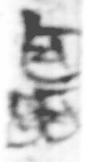聶（攝）
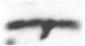一
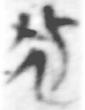狐
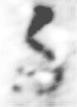白
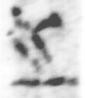之
